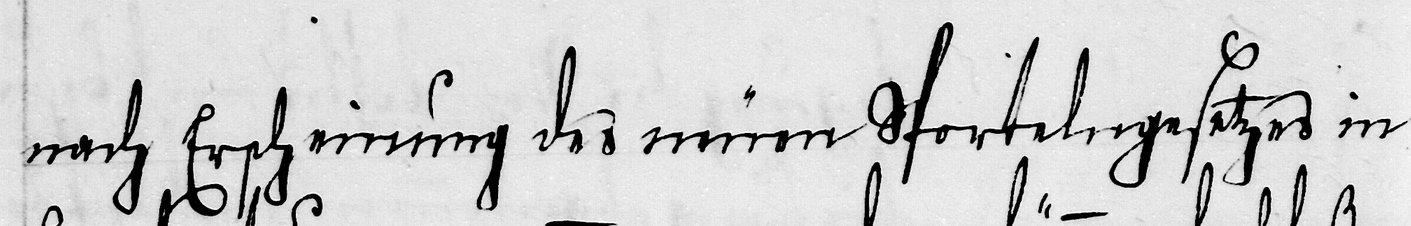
nach Erscheinung des neuen Sportelngesetzes in
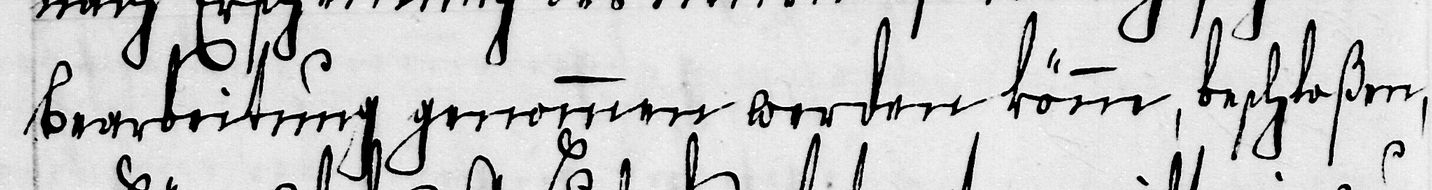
Bearbeitung genommen werden könne, beschloßen,
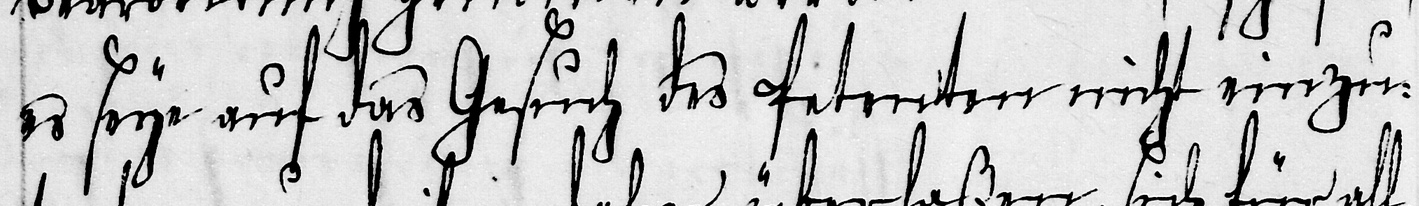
es seye auf das Gesuch des Petenten nicht einzu¬
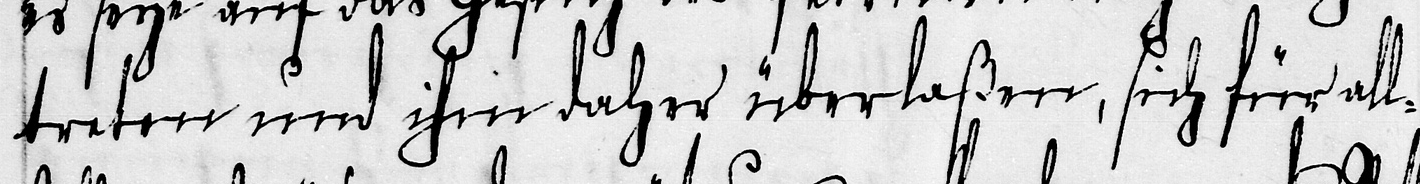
treten und ihm daher überlaßen, sich für all¬
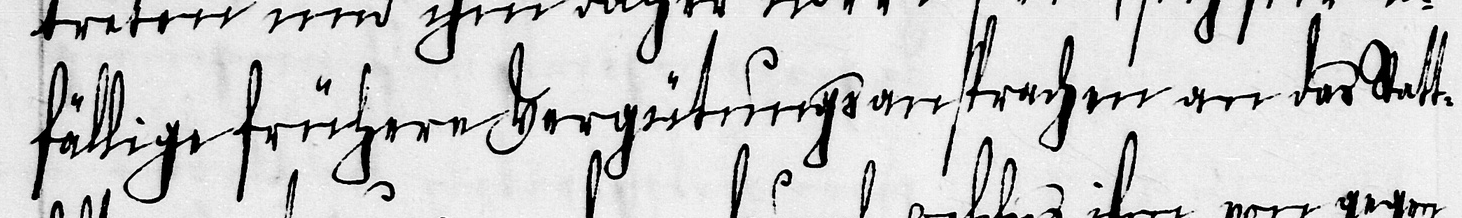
fällige frühere Vergütungsansprachen an das Stat¬
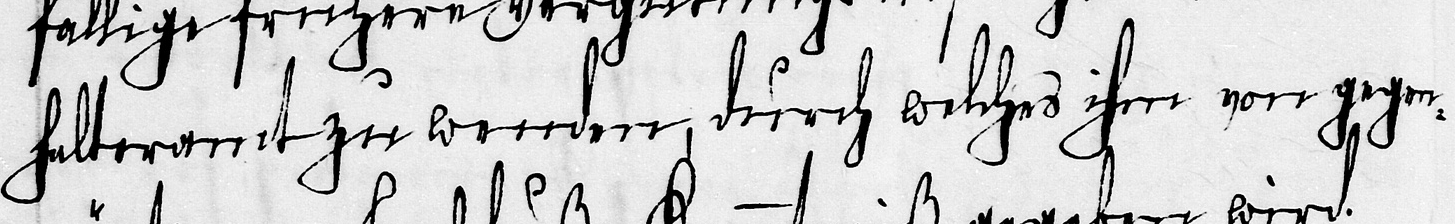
thalteramt zu wenden, durch welches ihm von gegen¬
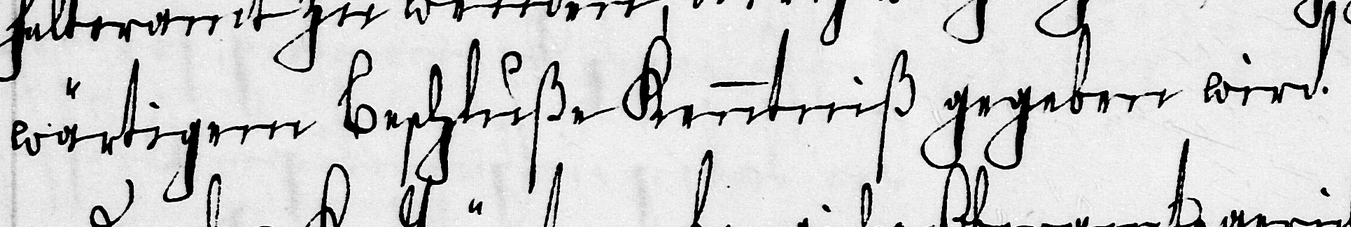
wärtigem Beschluße Kenntniß gegeben wird.
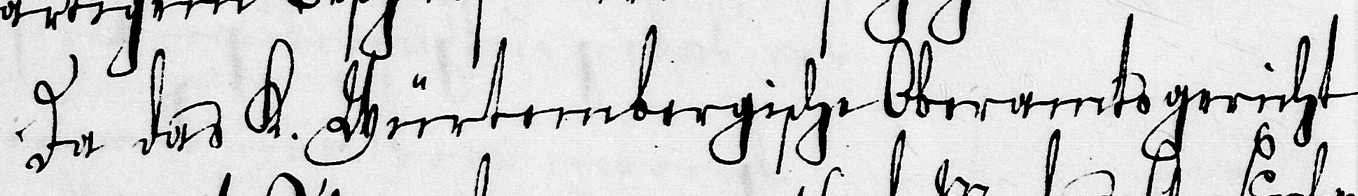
Da das K. Würtembergische Oberamtsgericht
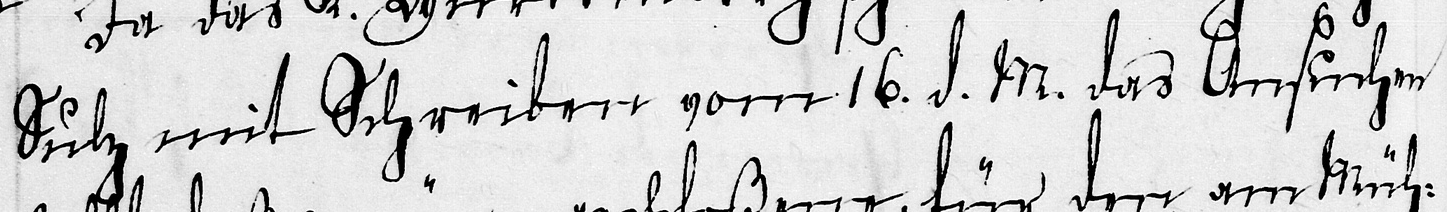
Sulz mit Schreiben vom 16. d. M. das Ansuchen
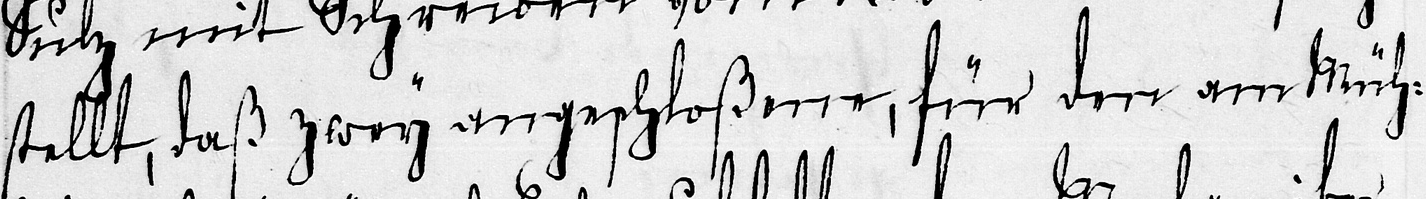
stellt, daß zwey angeschloßene, für den am Müh¬
